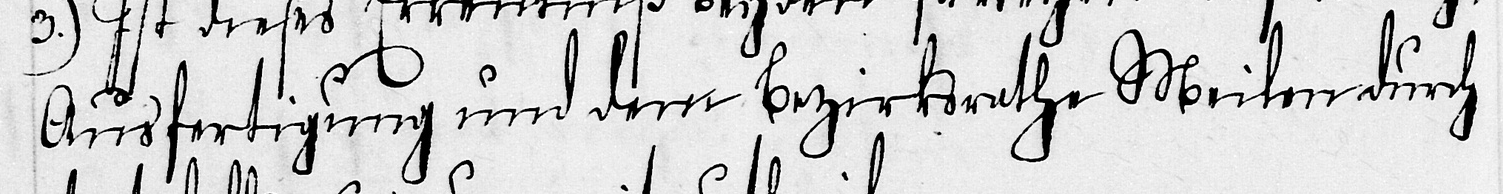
Ausfertigung und dem Bezirksrathe Meilen durch
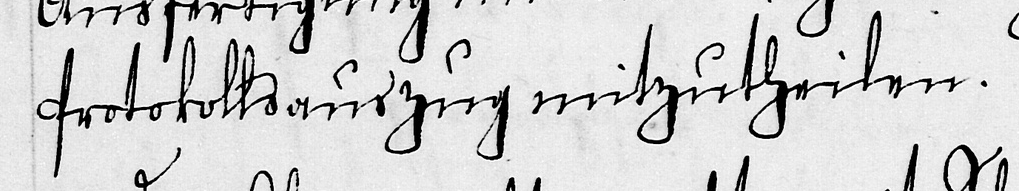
Protokollsauszug mitzutheilen.
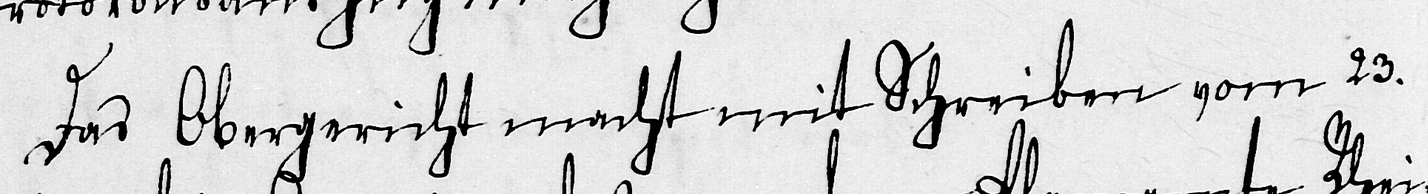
Das Obergericht macht mit Schreiben vom 23.
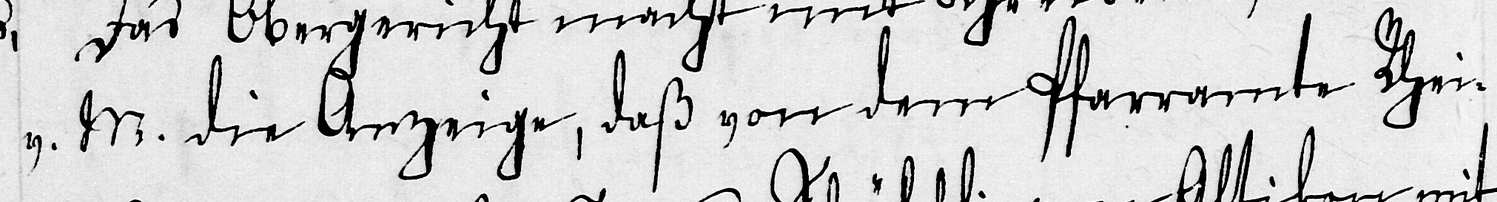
v. M. die Anzeige, daß von dem Pfarramte Rhei¬
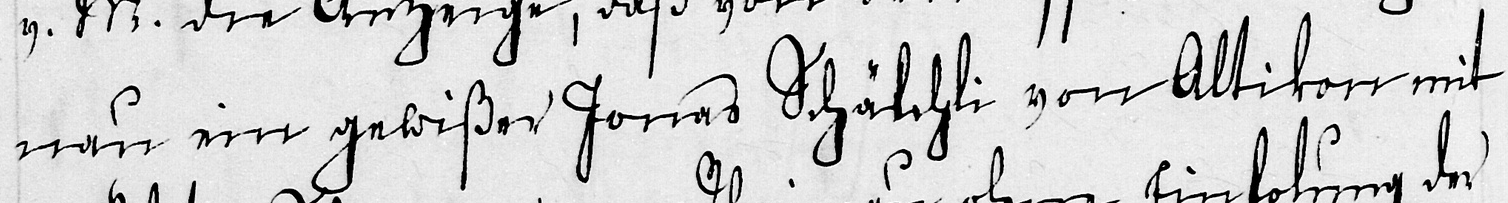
nau ein gewißer Jonas Schälchli von Altikon mit
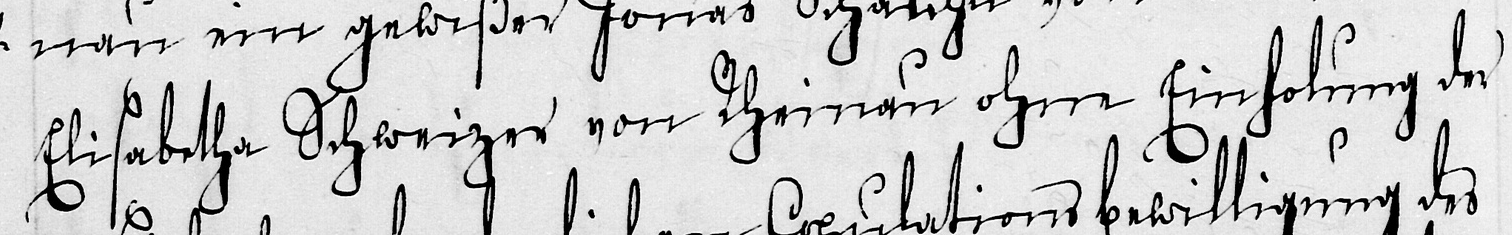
Elisabetha Schweizer von Rheinau ohne Einholung der
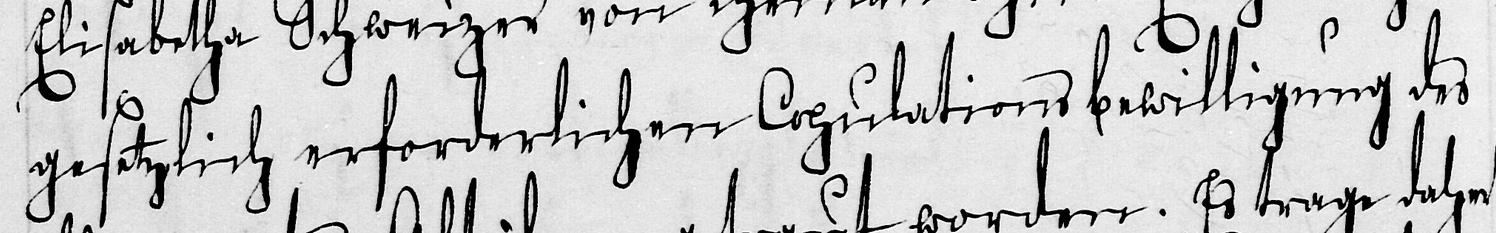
gesetzlich erforderlichen Copulationsbewilligung des
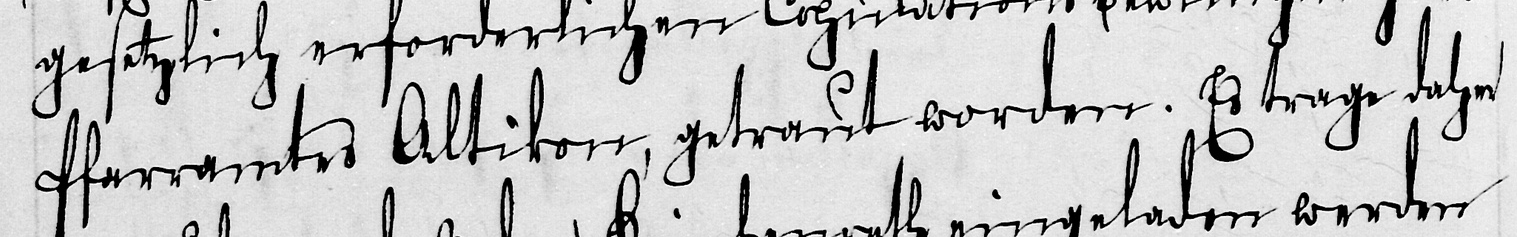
Pfarramtes Altikon, getraut worden. Es trage daher
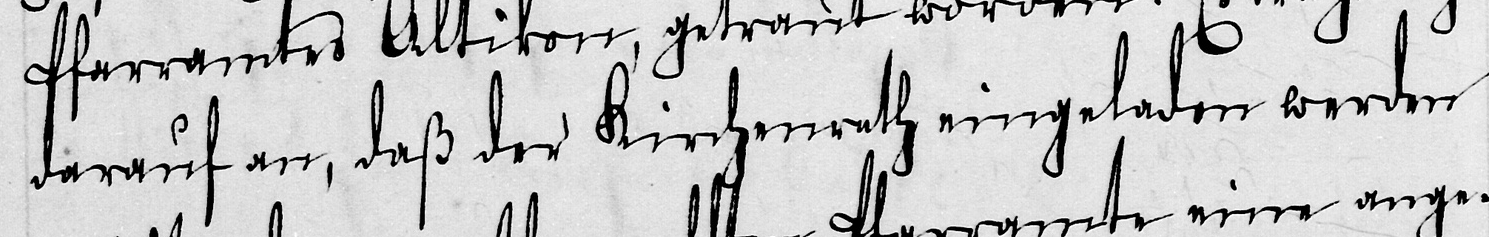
darauf an, daß der Kirchenrath eingeladen werden
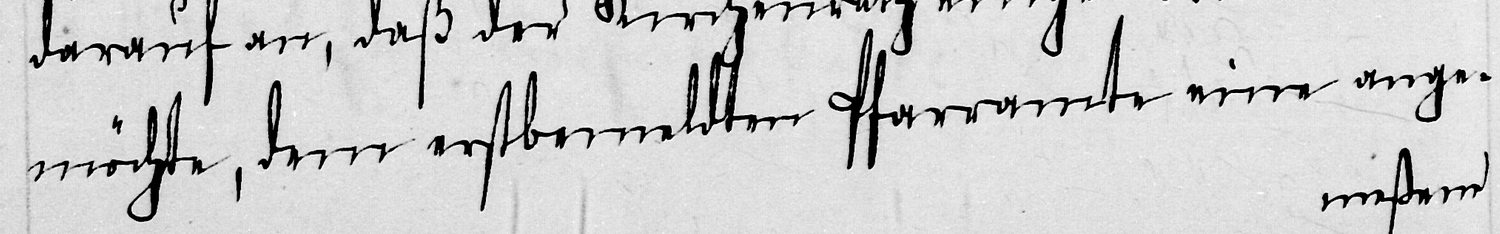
möchte, dem erstbemeldten Pfarramte eine ange-
